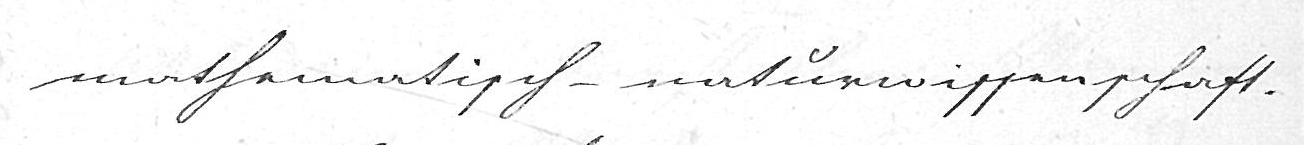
mathematisch-naturwissenschaft-
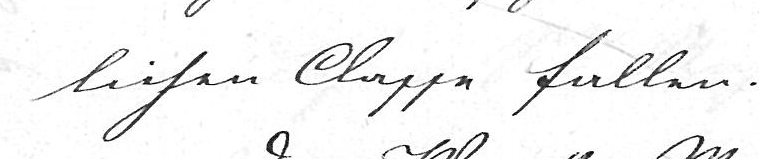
lichen Classe fallen.
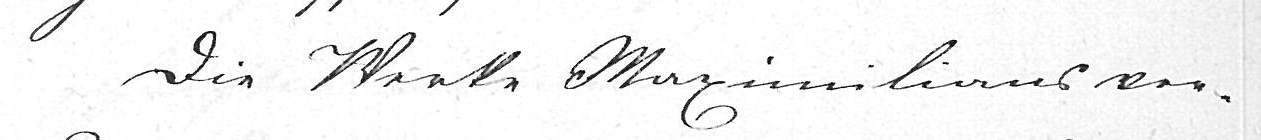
Die Werke Maximilians ver-
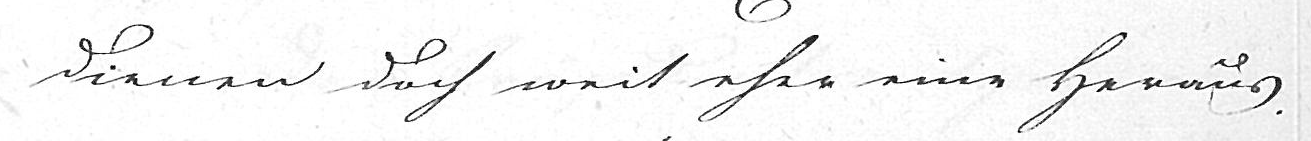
dienen doch weit eher eine Heraus-
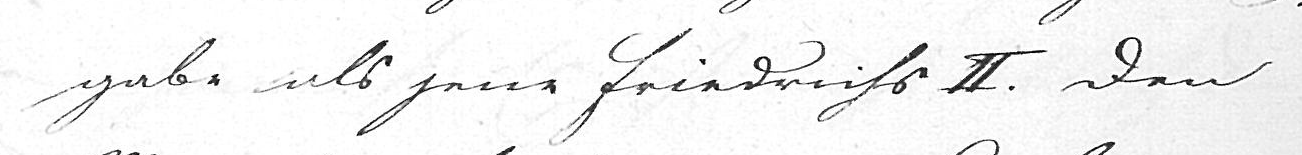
gabe als jene Friedichs II. Den
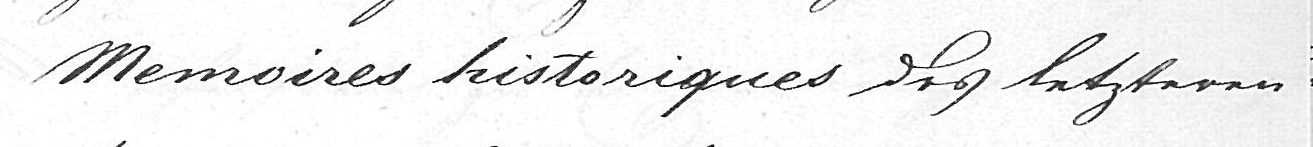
Memoires histeriques des letzteren
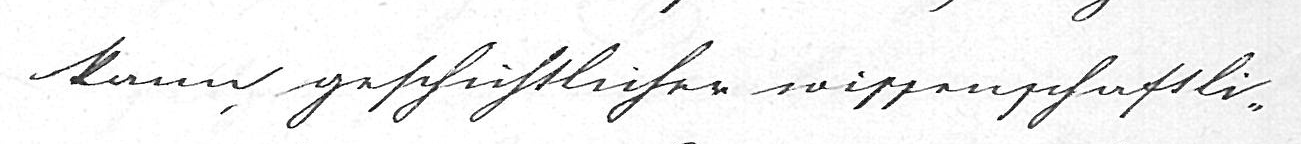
kann geschichtlicher wissenschaftli-
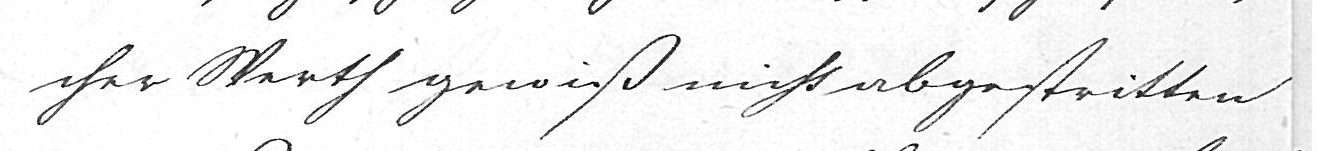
cher Werth gewiß nicht abgestritten
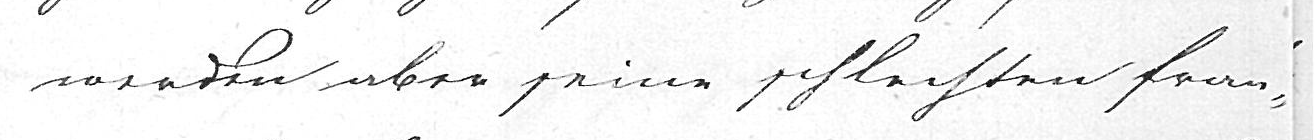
werden aber seine schlechten fran-
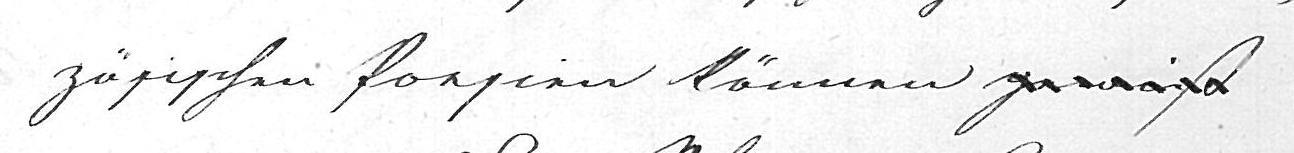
zösischen Poesien können gewiß
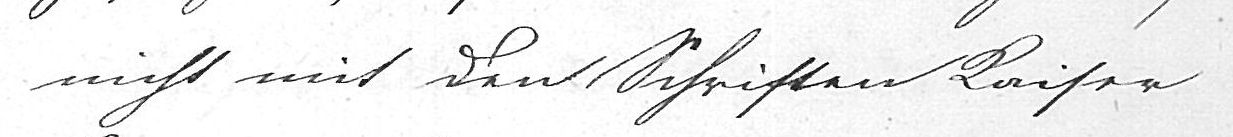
nicht mit den Schriften Kaiser
